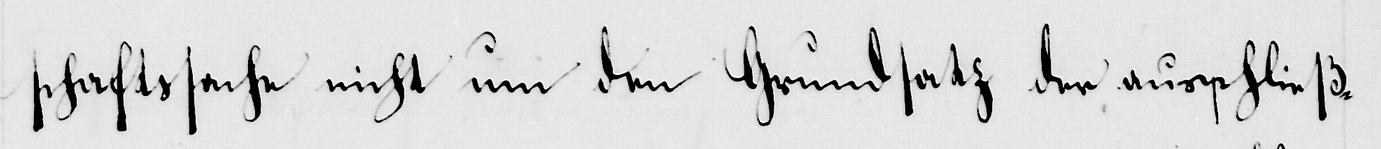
schaftssache nicht um den Grundsatz der ausschließ¬
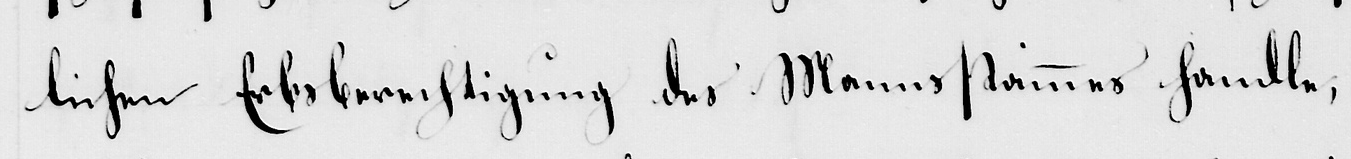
lichen Erbsberechtigung des Mannsstammes handle,
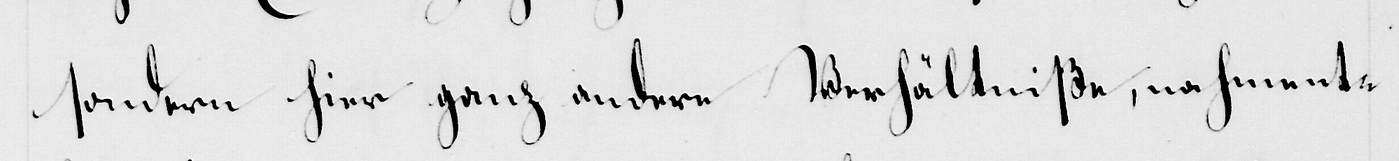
sondern hier ganz andere Verhältniße, nahment¬
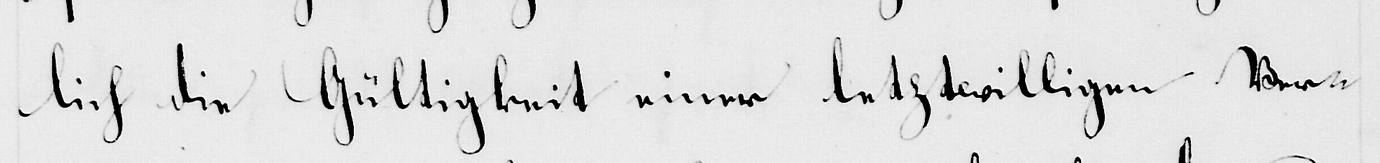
lich die Gültigkeit einer letztwilligen Ver¬
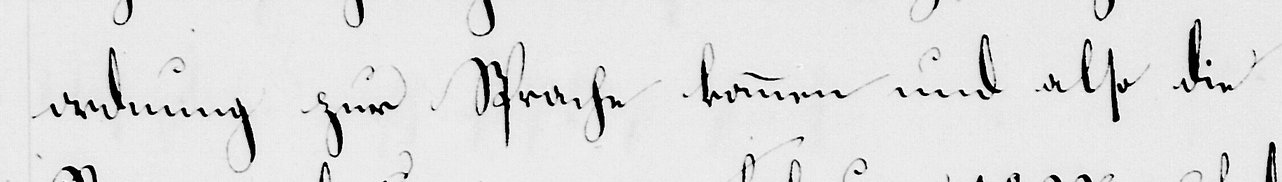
ordnung zur Sprache kommen und also die
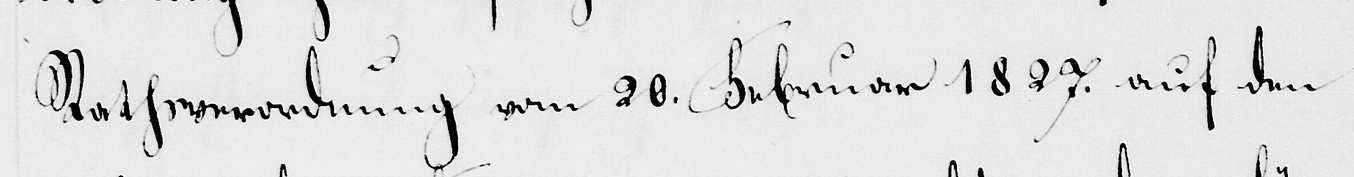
Rathsverordnung vom 20. Februar 1827. auf den
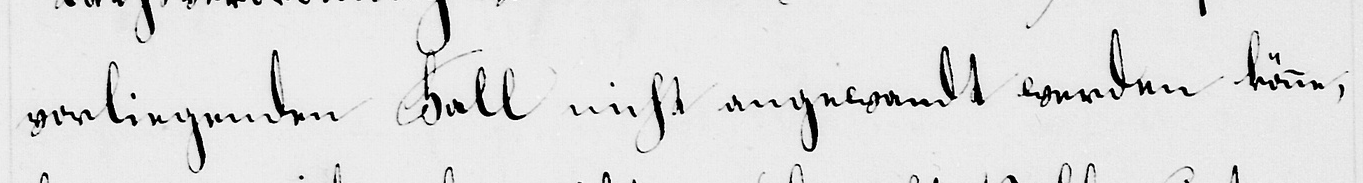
vorliegenden Fall nicht angewandt werden könne,
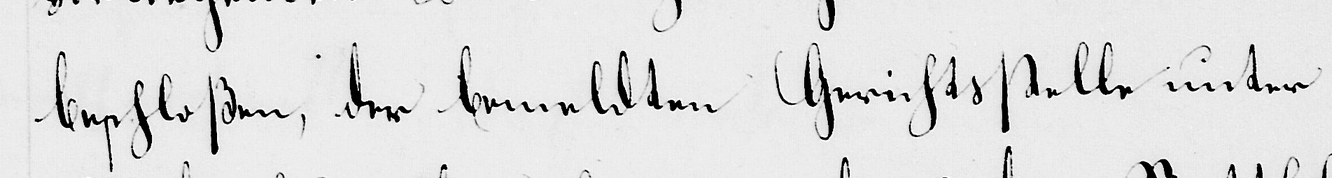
beschloßen, der bemeldten Gerichtsstelle unter
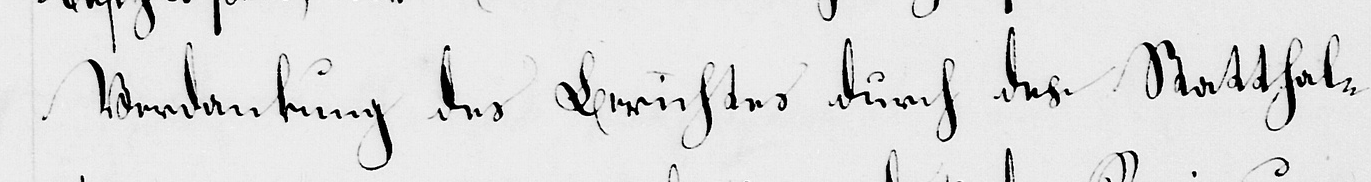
Verdankung des Berichtes durch das Statthal¬
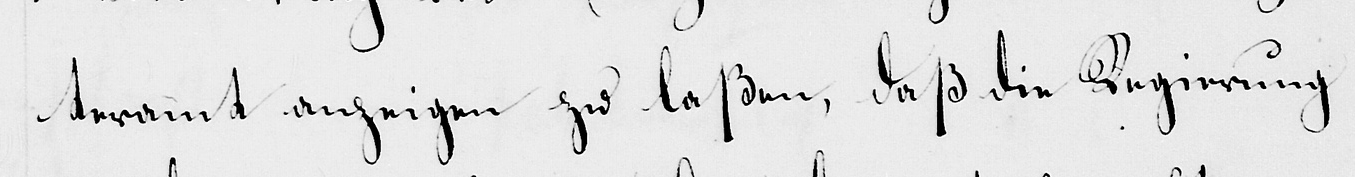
teramt anzeigen zu laßen, daß die Regierung
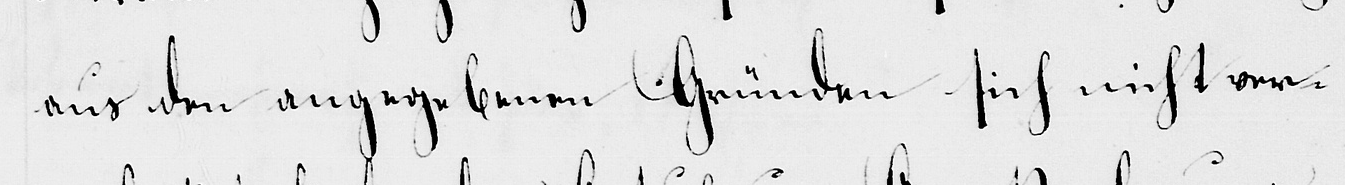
aus den angegebenen Gründen sich nicht ver¬
